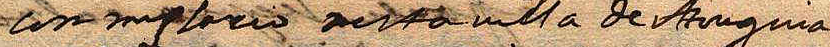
commissario nesta uilla de Atouguia
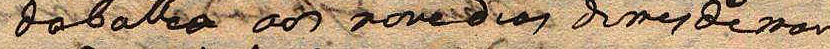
da ballea aos noue dias do mes de mar
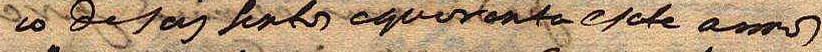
ço de seissentos e quarenta e sete annos
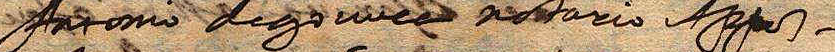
Antonio de gouuea notario Appos
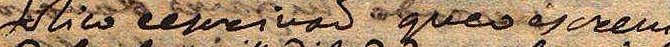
tolico e escriuaõ que o escreui
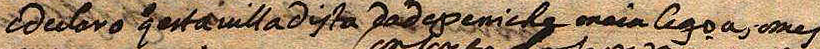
e declaro q̄ esta uilla dista da de peniche meia legoa, o mes
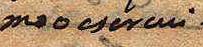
mo o escreui
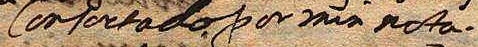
Consertado por min nota
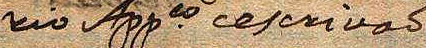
rio App.co e escrivaõ
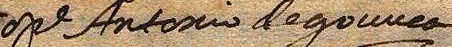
o pe Antonio de gouuea
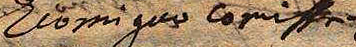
E comiguo comissa
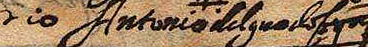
rio Antonio delguado figa
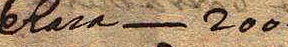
Raza – 200
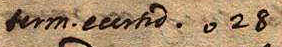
term. e certid. 028
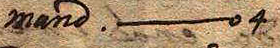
mand. – 04
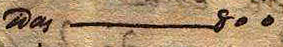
idas – 800
